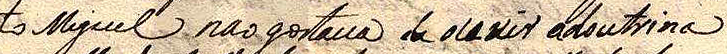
to Miguel nao gostaua de ouuir a doutrina
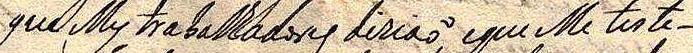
que elles trabalhadores diziaõ, e que elle teste
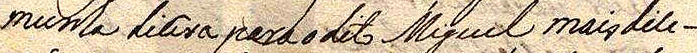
munha diCera para o dito Miguel, mais dice
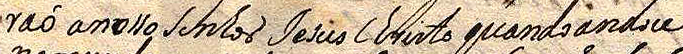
raõ a nosso senhor Jesus Christo quando andou
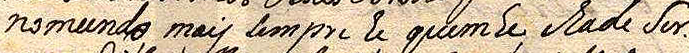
no mundo mais sempre he quem he, e ha de ser.
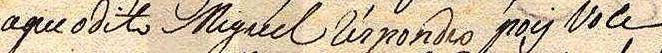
a que o dito Miguel Réspondeo pois Voce
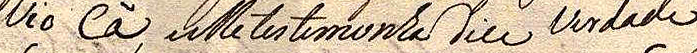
vio Cà, e elle testemunha dice verdade
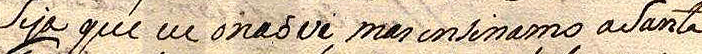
seja que ue o naõ ue, mas ensinamo a Santa
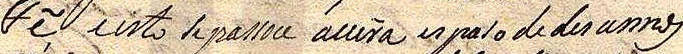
Fé, e isto se passou auera espaso de des annos
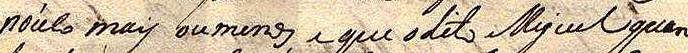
pouco mais ou menos, e que o dito Miguel quan
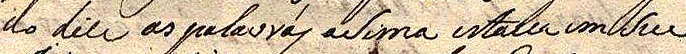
do dice as palavras asima estaua em seu
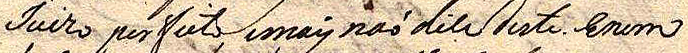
Iuizo perfeito, e mais naõ dice deste. E nem
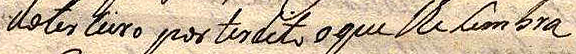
do terCeiro por ter dito o que lhe Lembra.
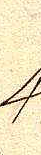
4
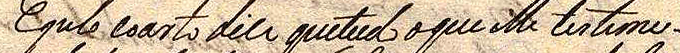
E pelo coarto dice que tudo o que elle testemu
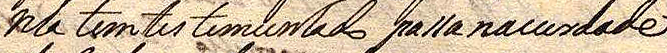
nha tem testemunhado passa na uerdade
